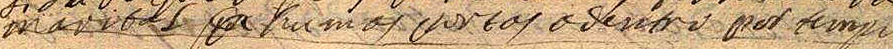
marital _ humas portas adentro por tempo
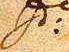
Jd:e
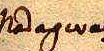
Nada geraes
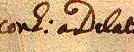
conh: a Delata
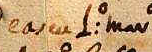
e a seu 1:o maro.
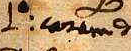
1o: cazamto da
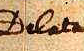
Delata.
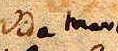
Vida mari
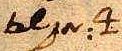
tal por :4:
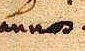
annos.
